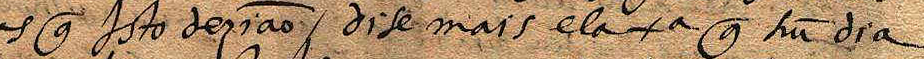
as q̄ Jsto dezião / dise mais ela ta q̄ hū dia
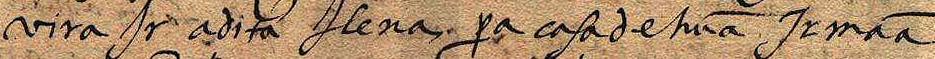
vira Jr a ditā Jlena ꝑa casa de huā Jrmaā
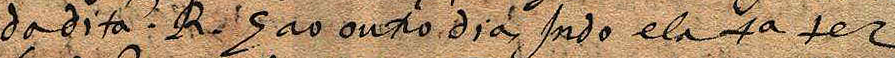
da ditā .R. E ao outro dia Jndo ela ta ter
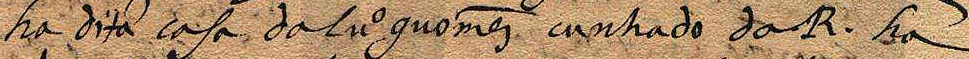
ha ditā casa daluo guomez cunhado da .R. ha
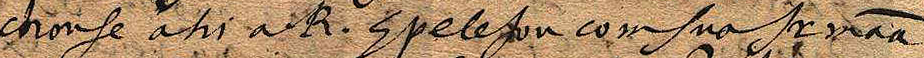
chouse ahi a .R. E peleJou com sua Jrmāa
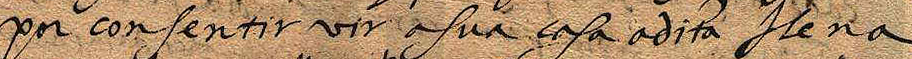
por consentir vir a sua casa a ditā Jlena
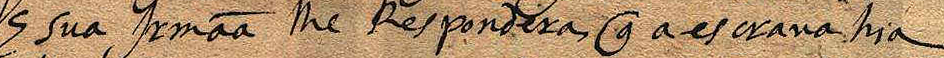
E sua Jrmāa lhe Respondera q̄ a escraua hia
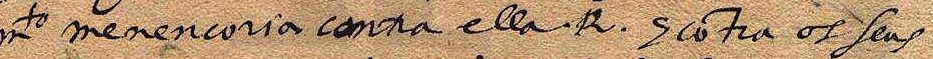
mto menencoria contra ella .R. E cōtra os seus
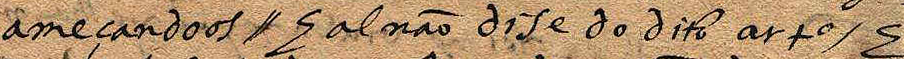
ameçandoos / E al não dise do ditō arto / E
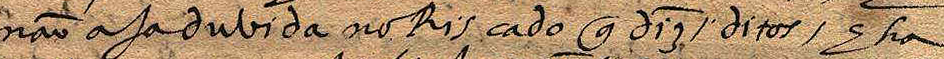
não aJa duvida no Riscado q̄ diz / ditos / E ha
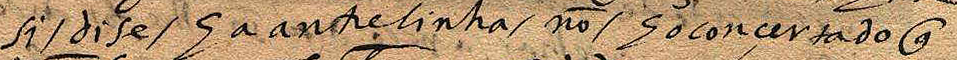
si / dise / E a antrelinha / nō / E o conçertado q̄
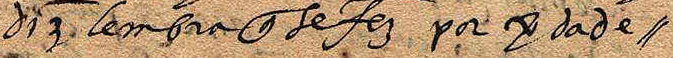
diz lembra q̄ se fez por ꝟdade //
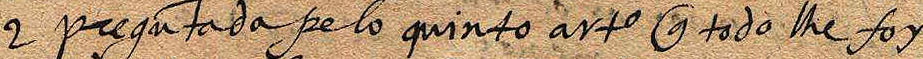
item pregūtada pelo quinto arto q̄ todo lhe foy
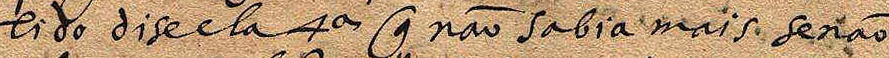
lido dise ela ta q̄ não sabia mais senão
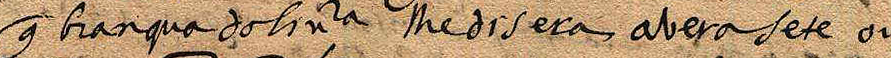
q̄ branqua doliura lhe disera avera sete ou
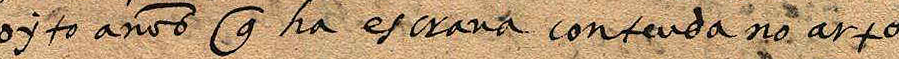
oyto an̄os q̄ ha escraua conteuda no arto
